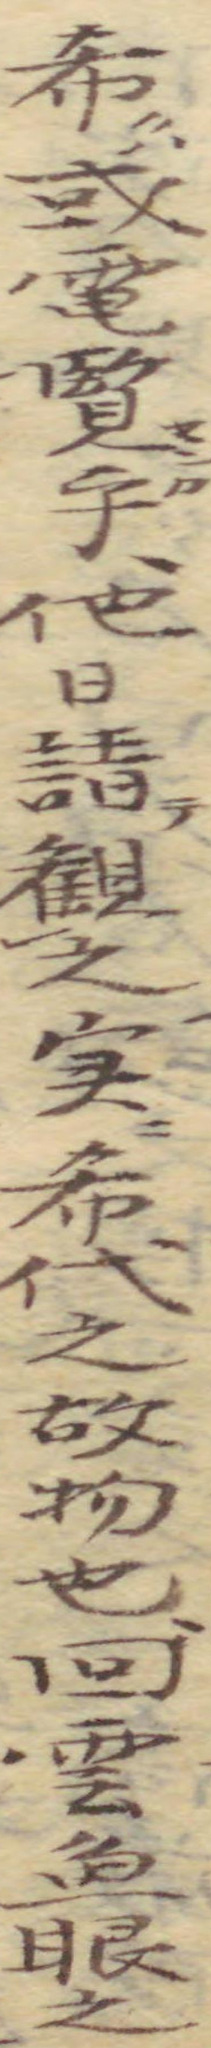希或電覧乎、他日請観之実希代之故物也、回雲魚眼之
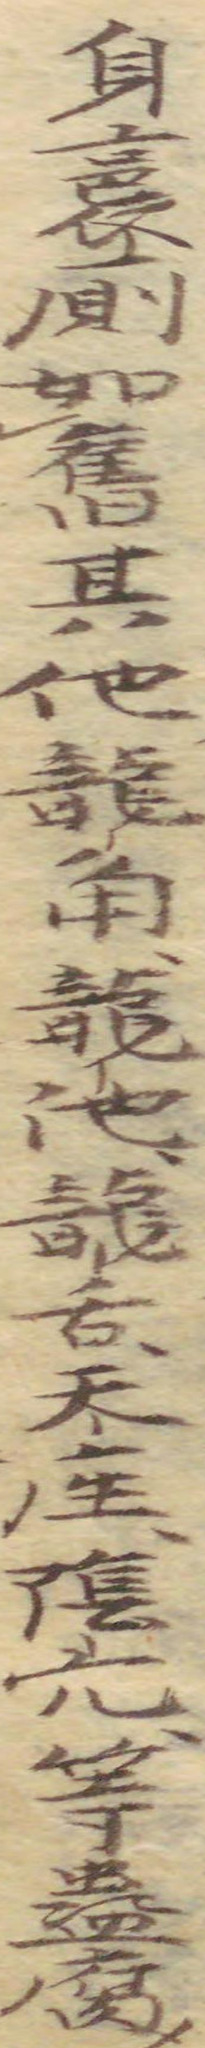身裛-廁如旧其他龍-角、龍-池、龍-舌、天-座、陰-穴、等蠱腐

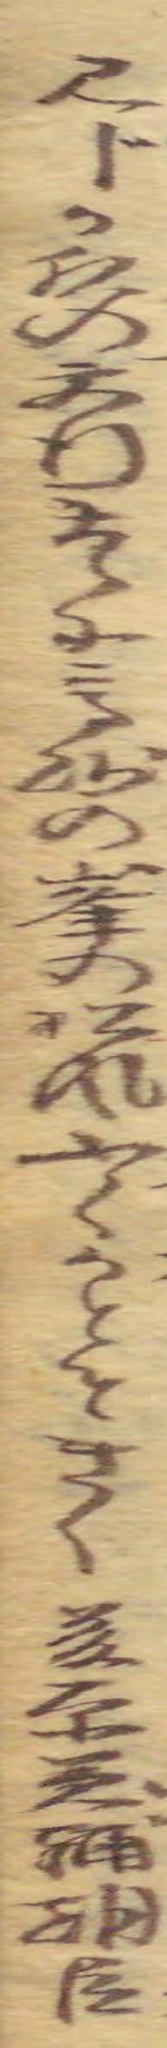みしか夜の更行まゝに高砂の峰の松風ふくかとそきく藤原兼輔朝臣

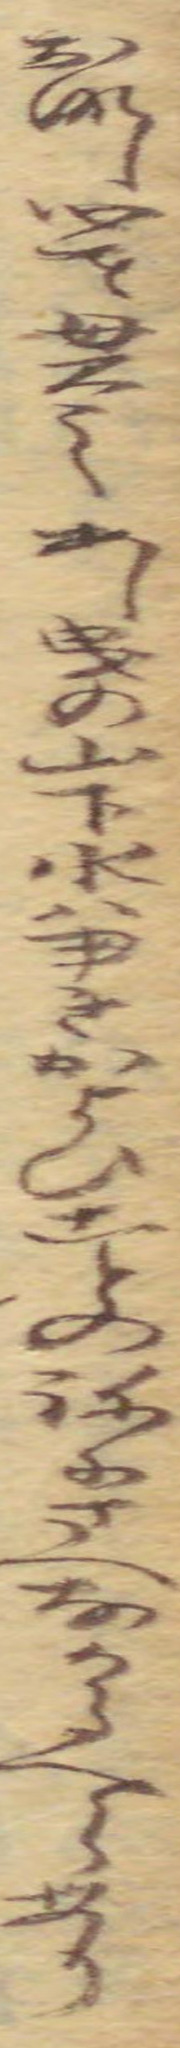おなし心を貫之あし曳の山下水はゆきかよひことのねにさへなかるへらなり
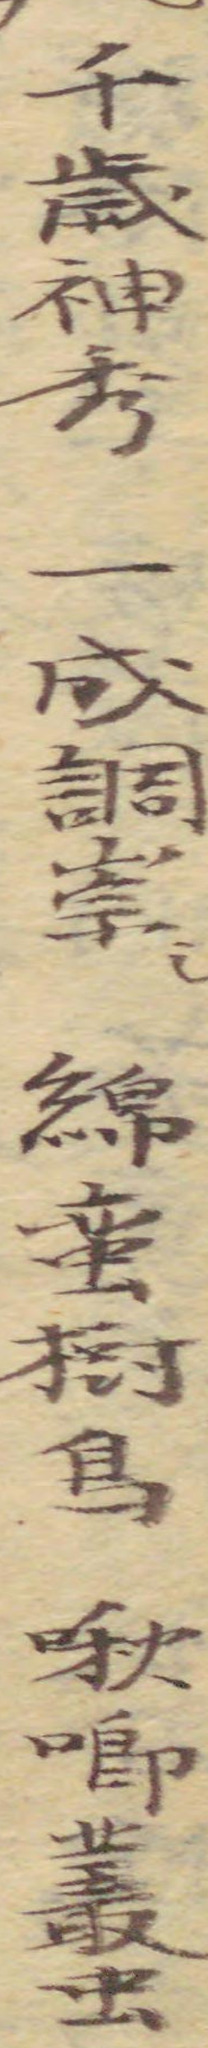千歳神秀一成調崇綿蛮樹鳥啾喞叢虫
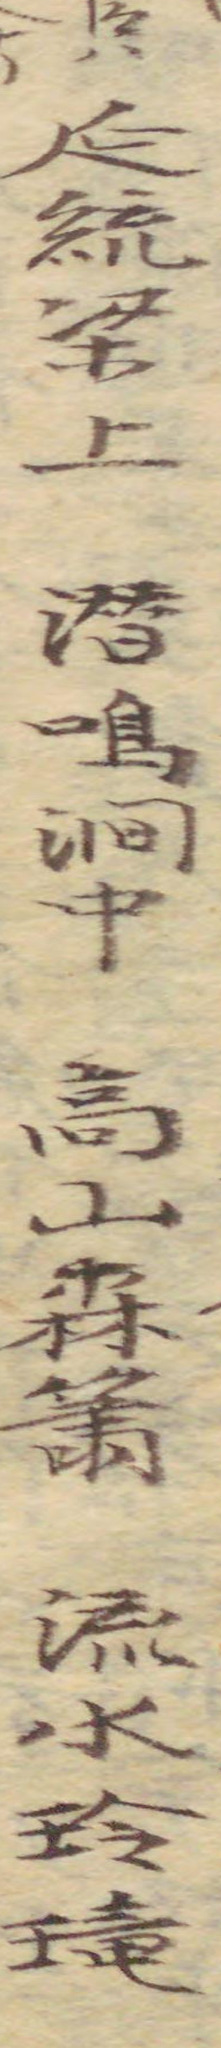延統梁上潜鳴澗中高山森簫流水玲瓏
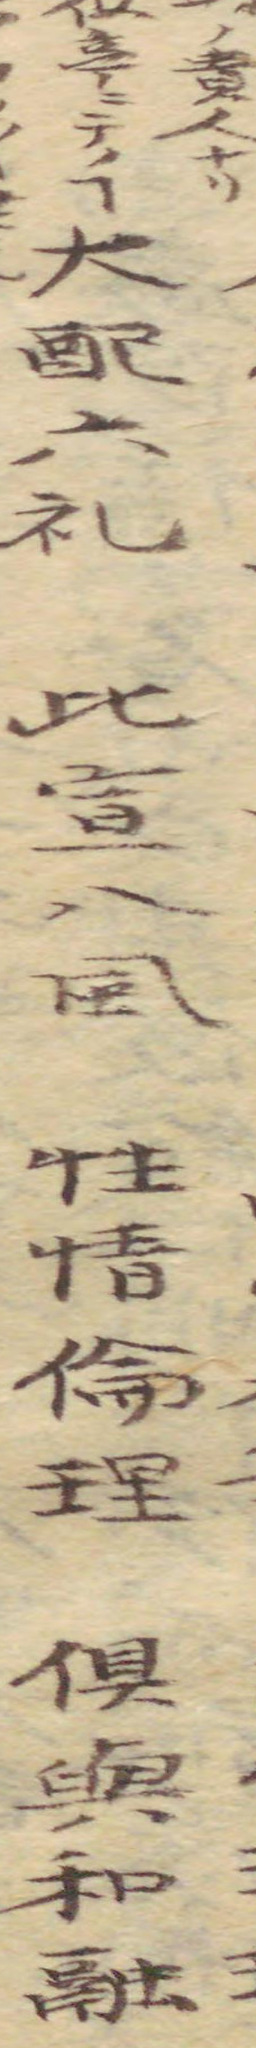大配六礼此宣八風性情倫理倶与和融
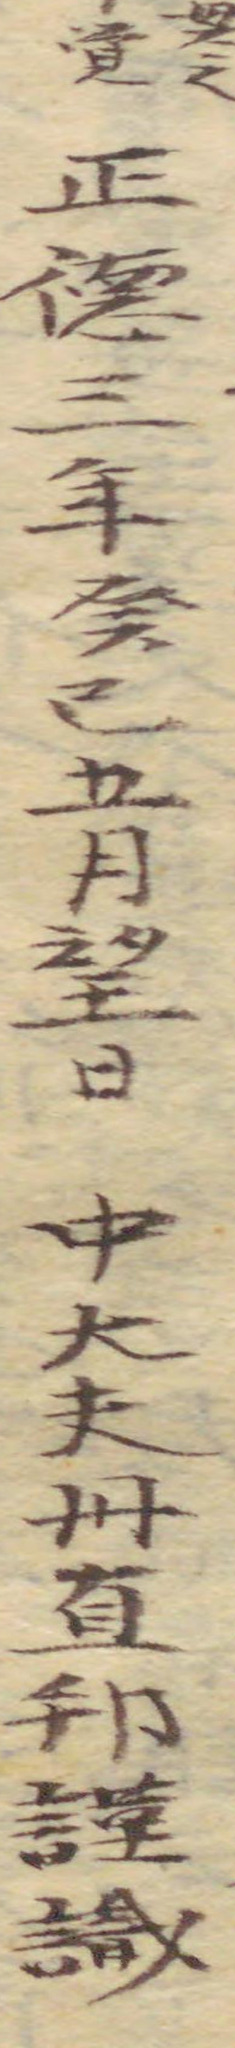正徳三年癸巳五月望日中大夫丹直邦謹識
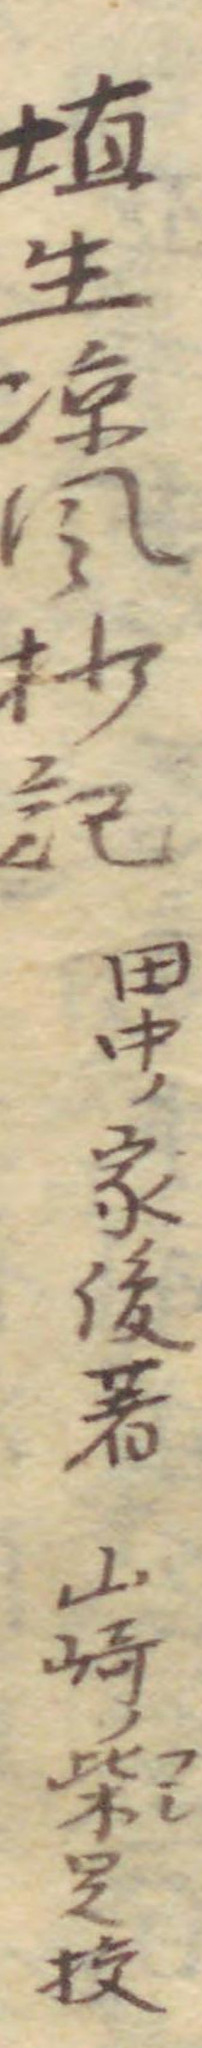埴生涼風抄記田中ノ家後著山崎ノ柴足校
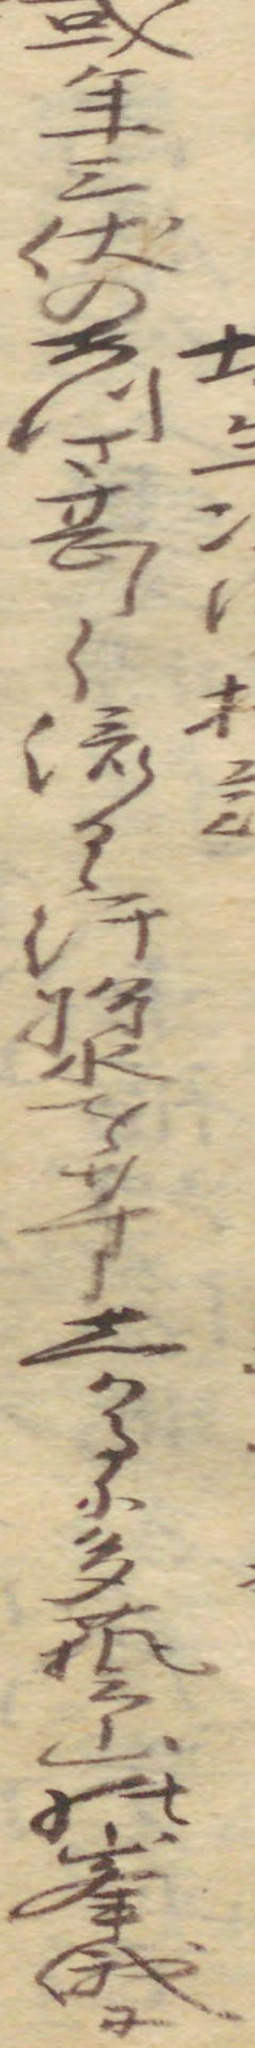或年三伏のあつさ甚しく流るゝ汗漿をなすしかるに多藝山の峰俄に
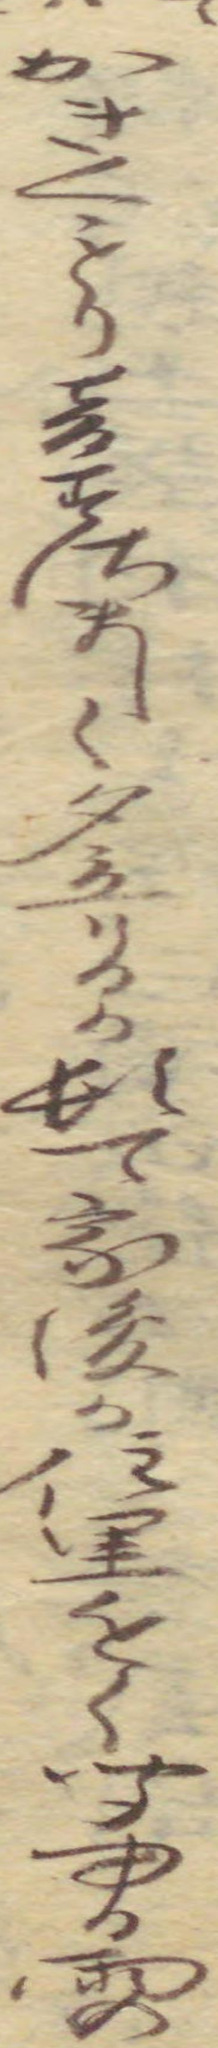かきくもり音すさましく夕立けるか頓て家俊か住里近く聞ゆる雨の
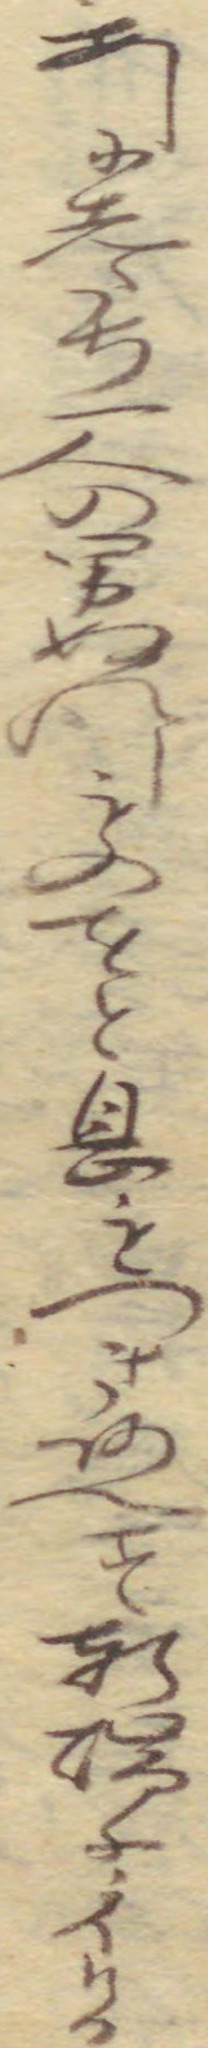あしに先たち一人の男ぬれしものをと息もつきあへす軒端に彳ける
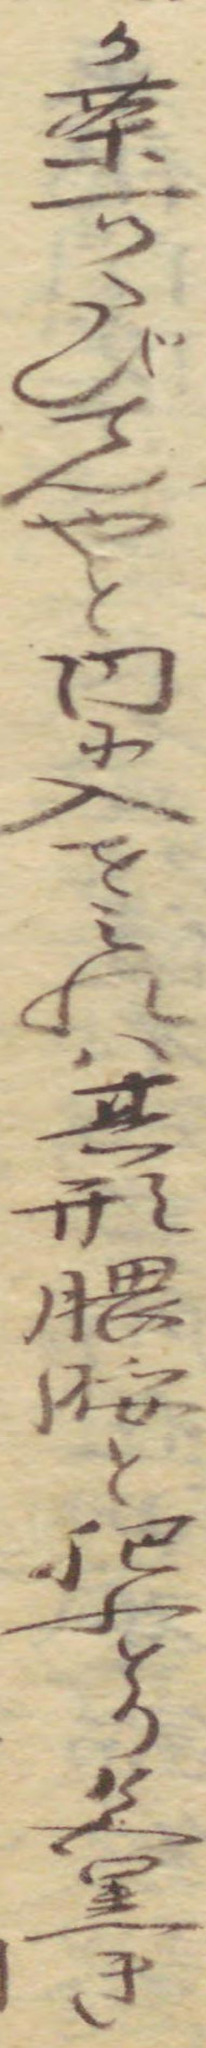か茶一ツたびてんやと内に入をみれは其形腲胺と肥ふとり色黒き
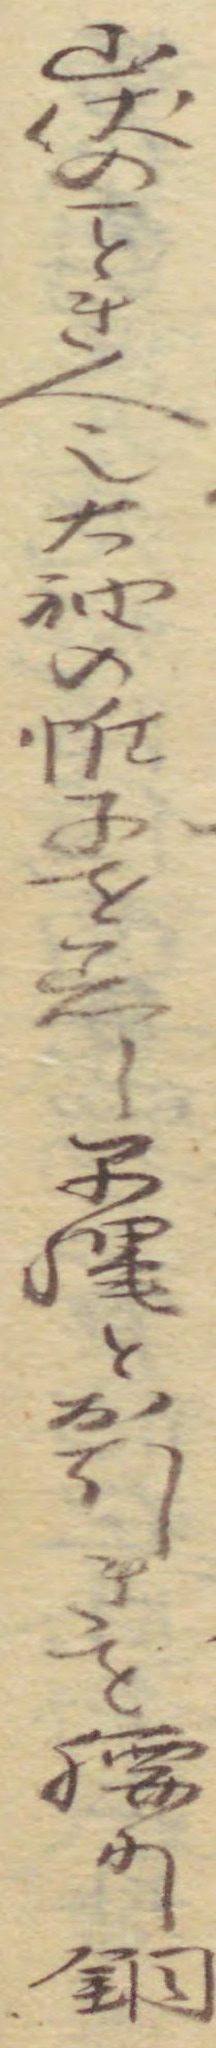山伏のことき人也大袖の帷子を着し早縄とおほしきを腰にし銅
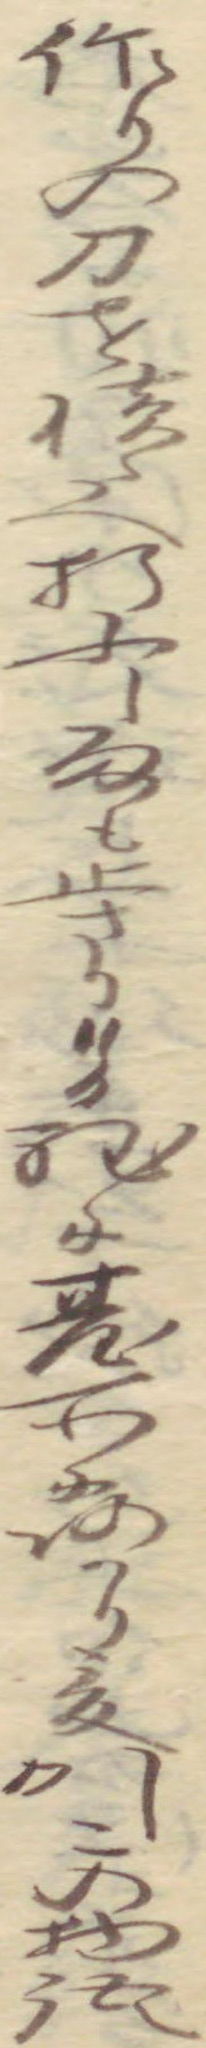作りの刀をたへ折ふし雨も止さりける程に台所にあかり爰かしこの物語
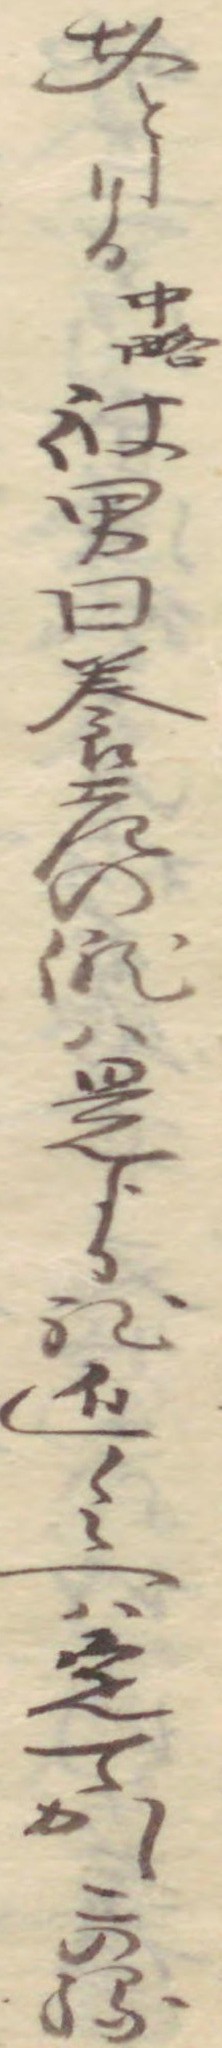なとしける中略彼男曰養老の滝は是より程近く候へは定てかしこの縁
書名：鶯宿雑記. 巻263-264
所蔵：国立国会図書館 National Diet Library, JAPAN
